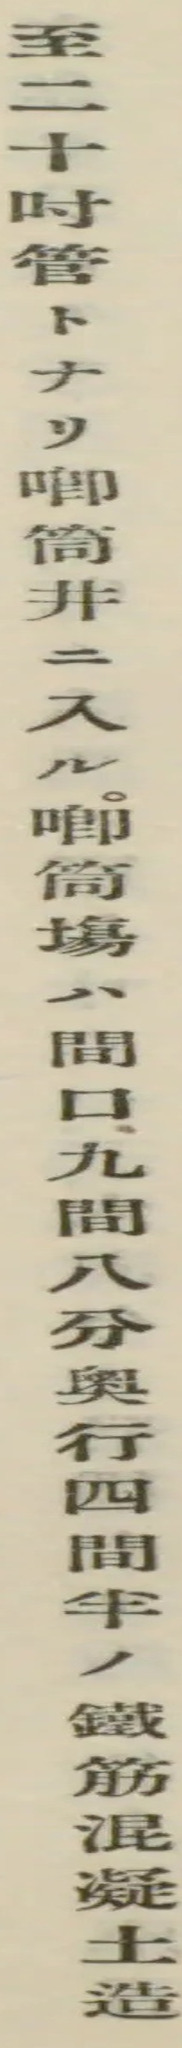至二十吋管とななり喞筒井に入る。喞筒場は間口、九間八分奥行四間半の鉄筋混凝土造
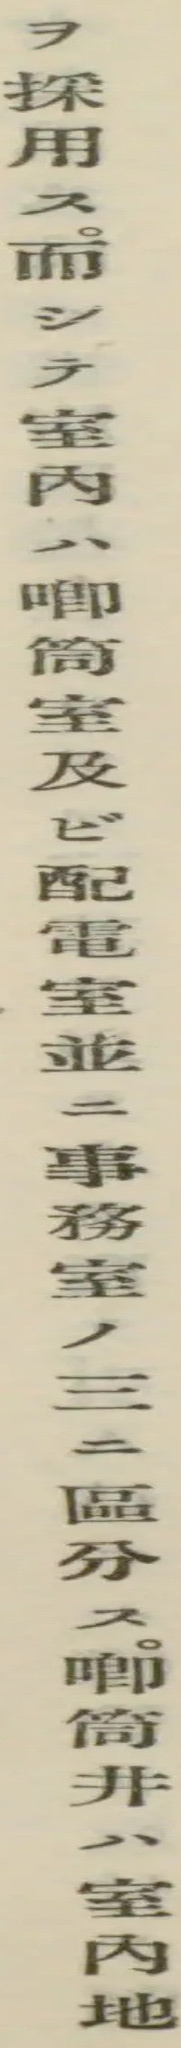を採用す。而して室内は喞筒室及び配電室並に事務室の三に区分す。喞筒井は室内地
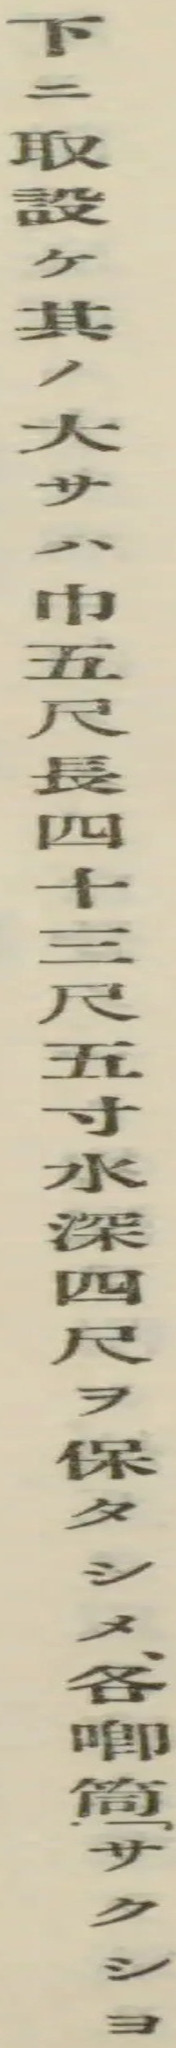下に取設け其の大さは巾五尺長四十三尺五寸水深四尺を保たしめ、各喞筒「サクショ
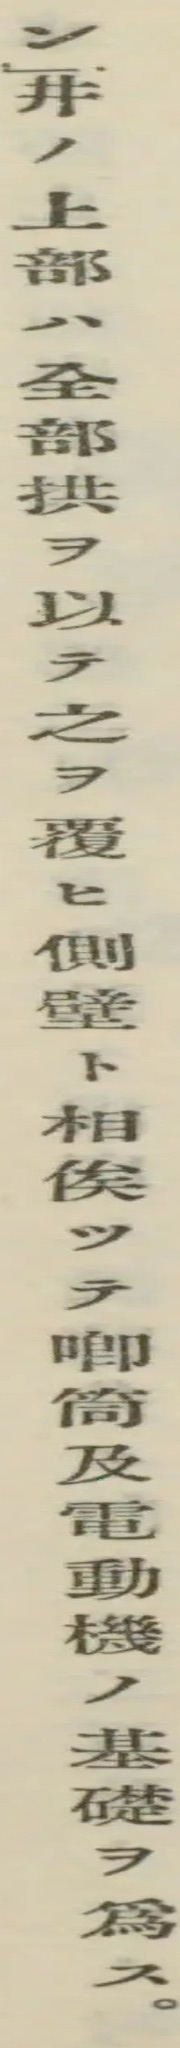ン」井の上部は全部拱を以て之を覆ひ側壁と相俟つて喞筒及電動機の基礎を為す。
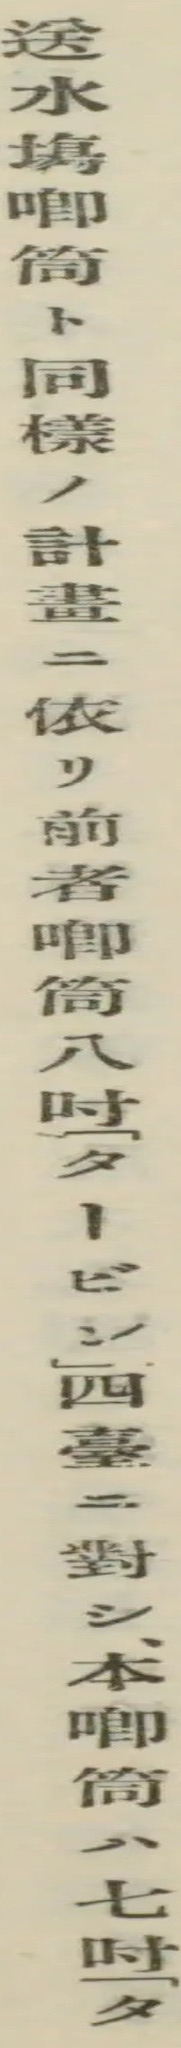送水場喞筒と同様の計畫に依り前者喞筒八吋「タービン」四臺に対し、本喞筒は七吋「タ
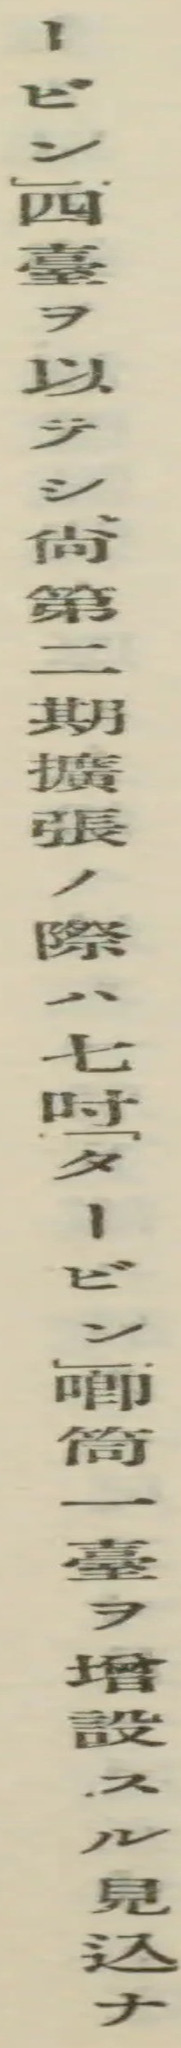ービン」四臺を以てし、尚第二期拡張の際は七吋「タービン」喞筒一臺を増設する見込な
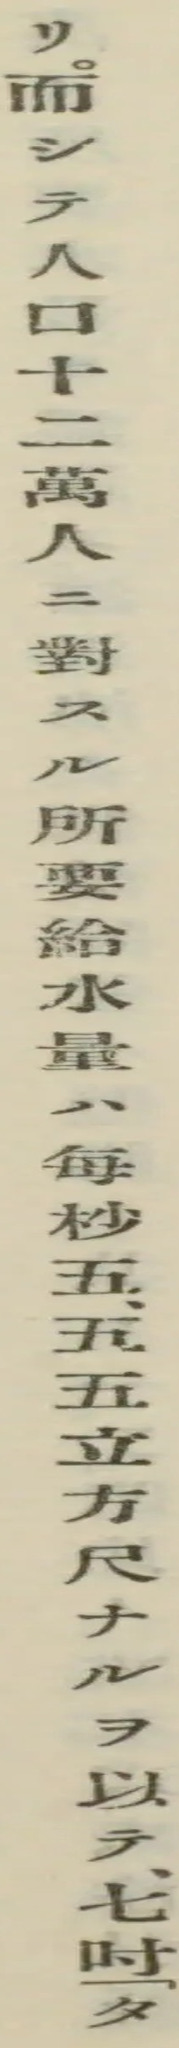り。而して人口十二まん萬人に対する所要給水量は毎秒五、五五立方尺なるを以て、七吋「タ
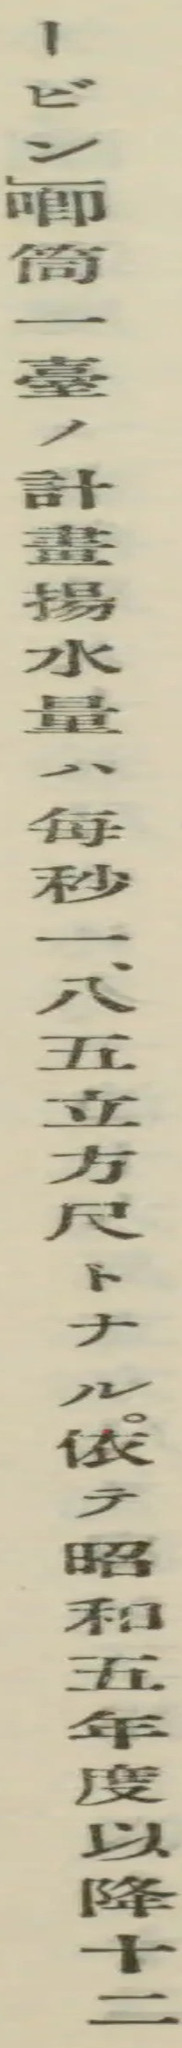ービン」喞筒一臺の計画揚水量水量は毎秒一、八五立方尺となる。依て昭和五年度以降十二
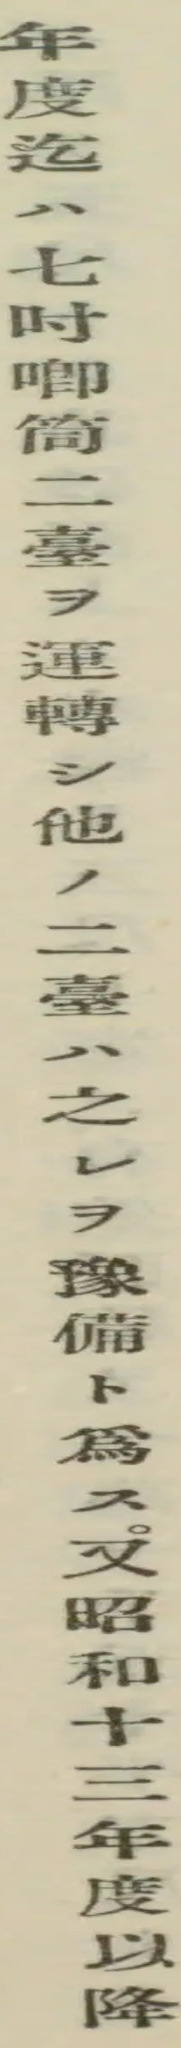年度迄は七吋喞筒二臺を運転し他の二臺は之れを予備と為す。又昭和十三年度以降
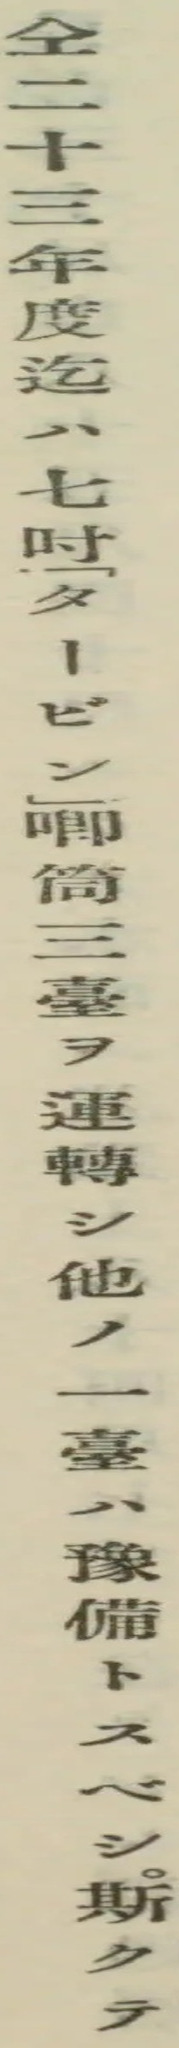同二十三年度迄は七吋「タービン」喞筒三臺を運転し他の一臺は予備とすべし。斯くて
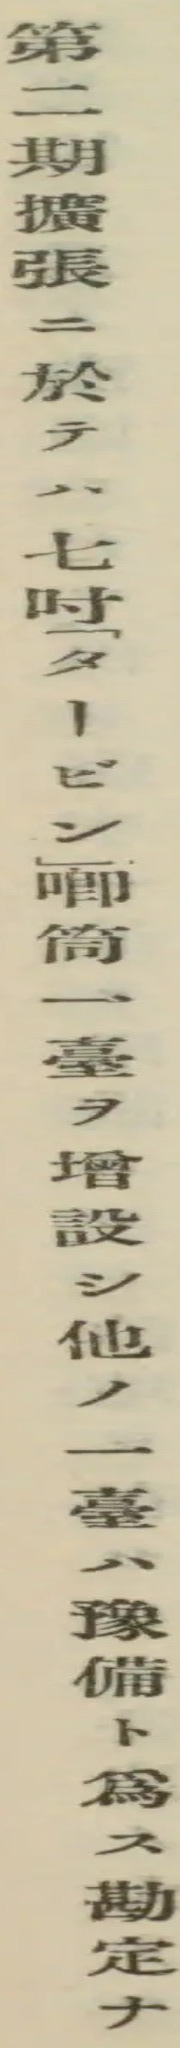第二期拡張に於ては七吋「タービン」喞筒一臺を増設し他の一臺は予備と為す勘定な
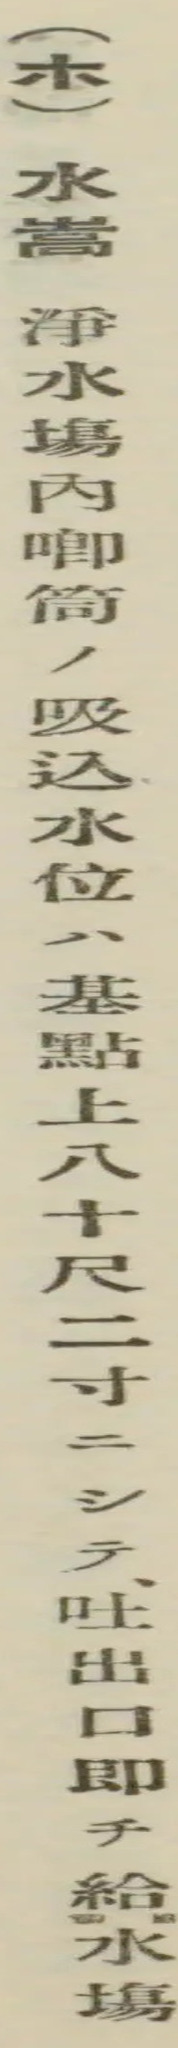(ホ)水嵩浄水場内喞筒の吸い込水位は基点八十尺二寸にして、吐出口即ち給水場
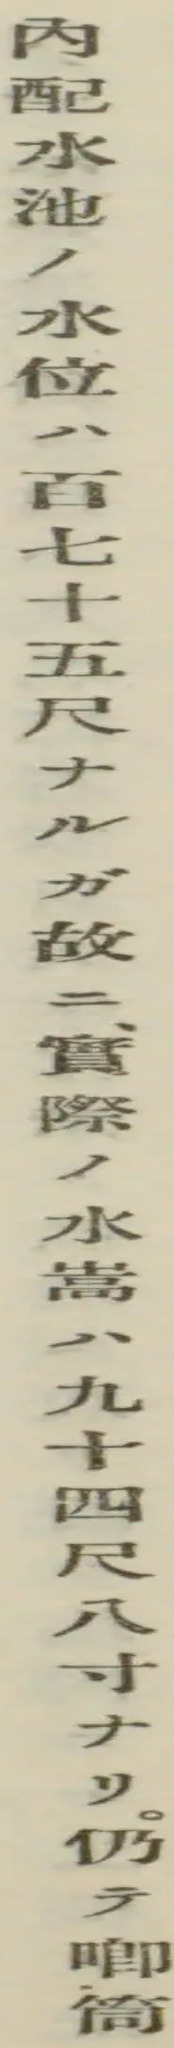内配水池の水位は百七十五尺なるが故に、実際の水嵩は九十四尺八寸なり。仍て喞筒
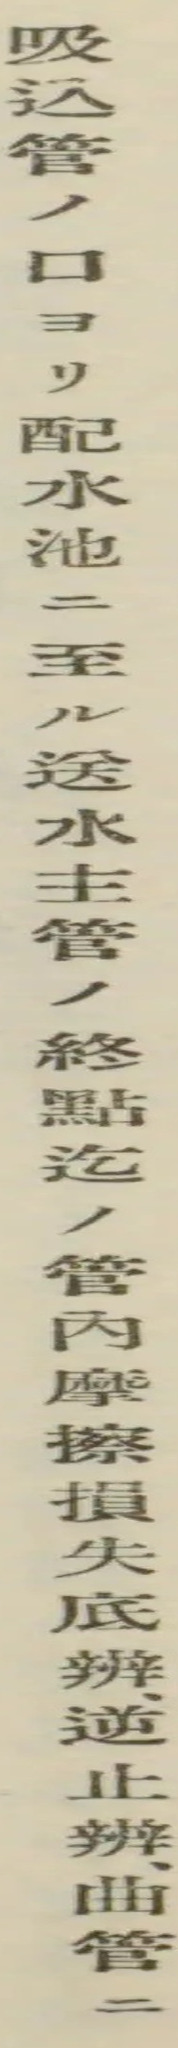吸込管の口より配水池に至る送水主管の終点迄の管内摩擦損失底辨、逆止辨、曲管に
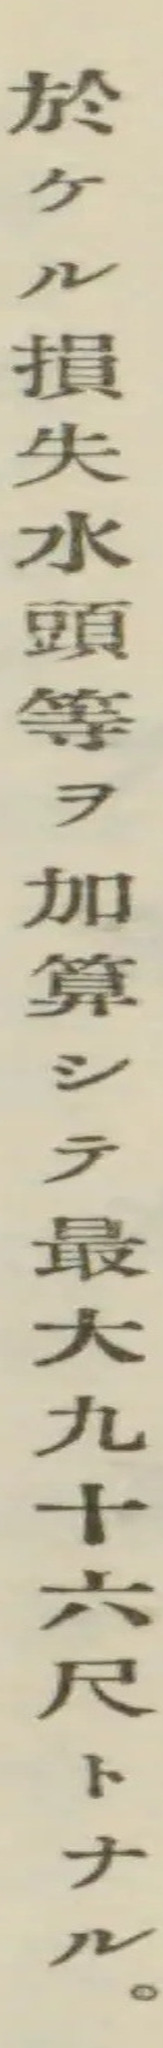於ける損失水頭等を加算して最大九十六尺となる。
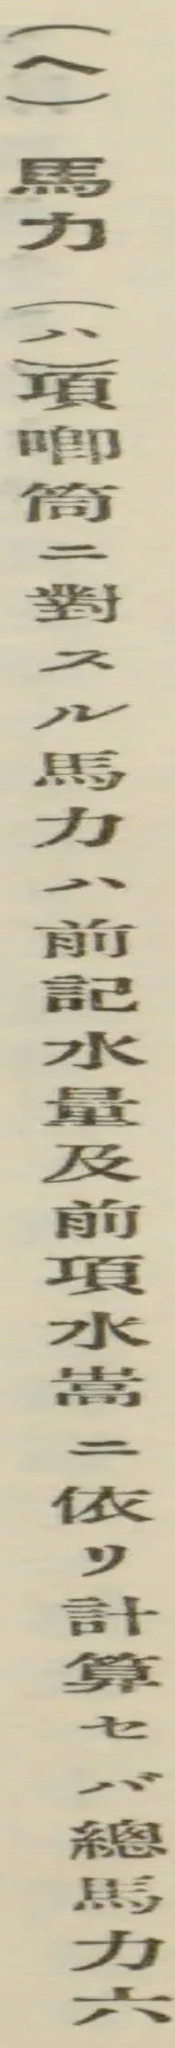(へ)馬力(ハ)項喞筒に対する馬力は前記水量及前項水嵩に依り計算せば総馬力六
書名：豊橋市水道誌
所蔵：国立国会図書館 National Diet Library, JAPAN
